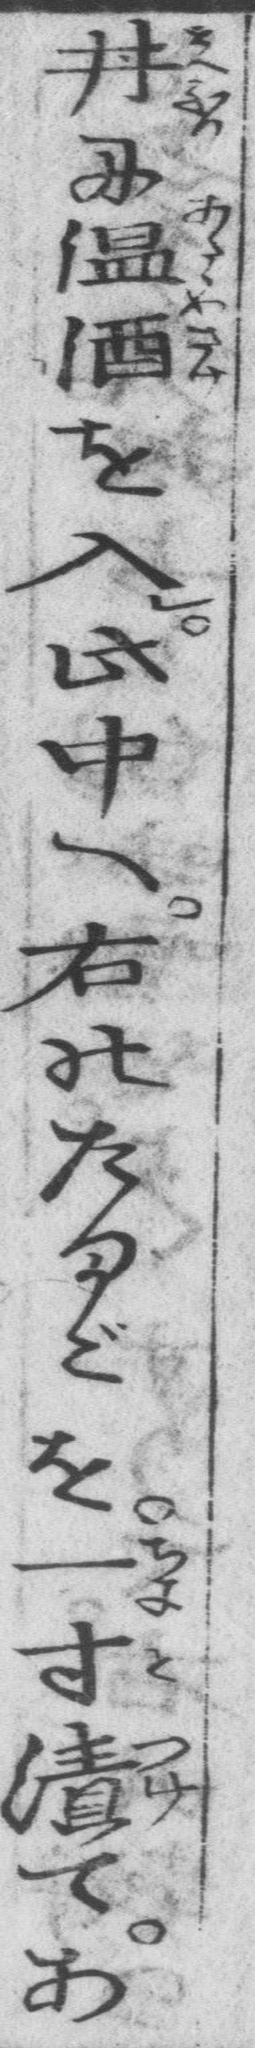丼に温酒を入れ。此中へ。右のたまごを。一寸漬て。あ
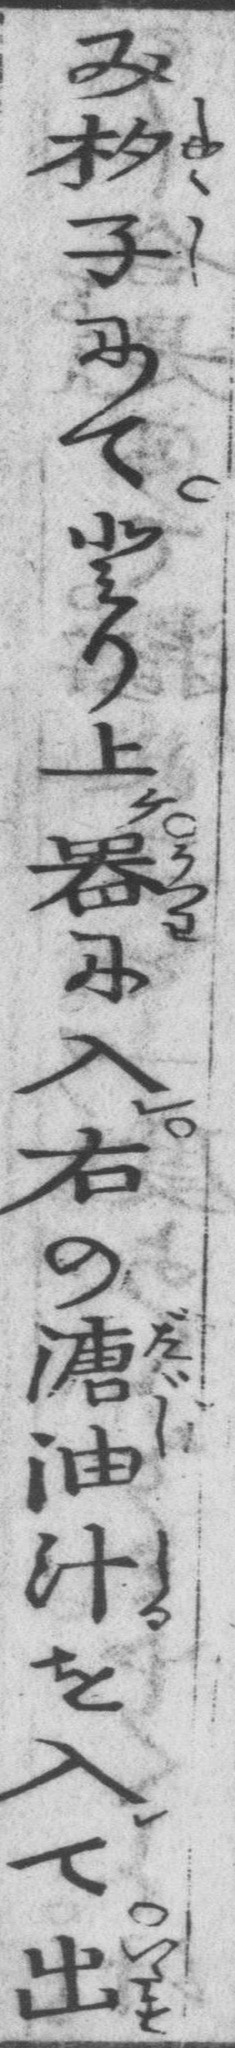み杓子にて。とり上け。器に入れ。右の溏油汁を入れて。出
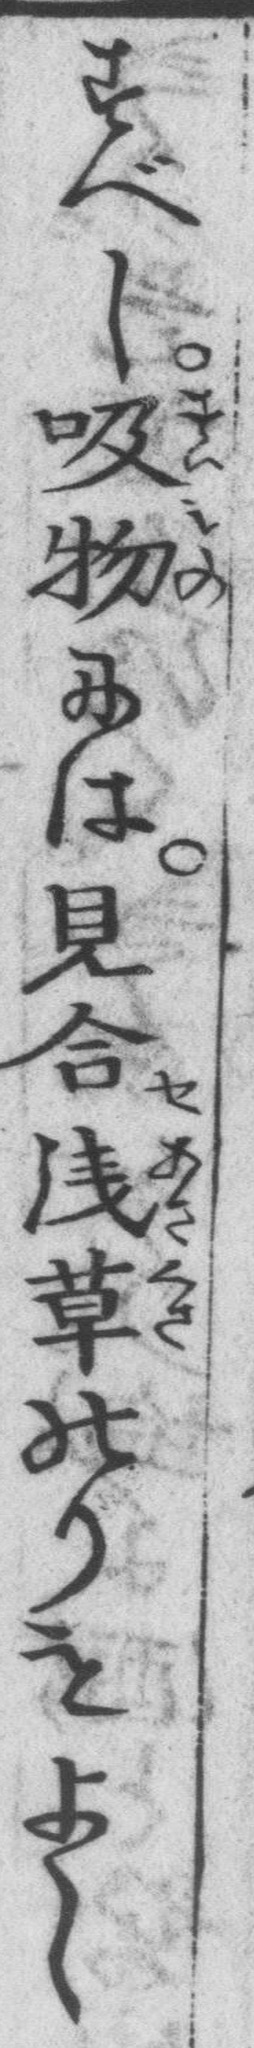すべし。吸物には。見合せ浅草のりもよし
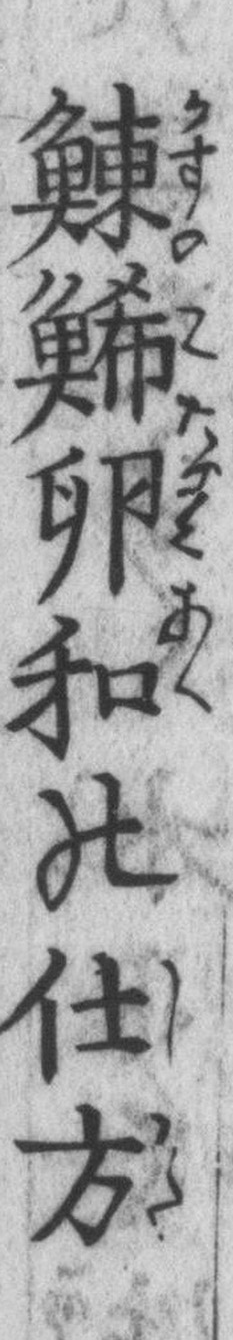鰊鯑卵和の仕方

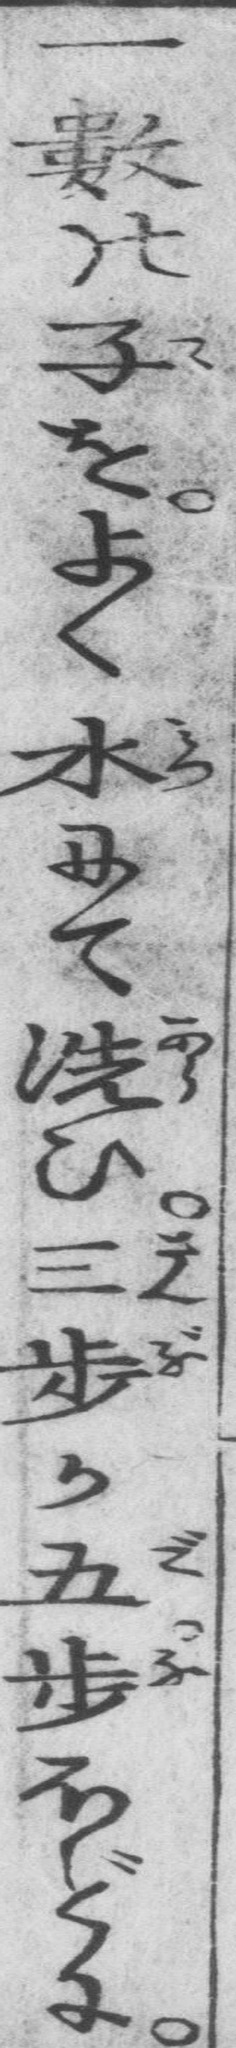一数の子を。よく水にて洗ひ。三歩か五歩ほどに。
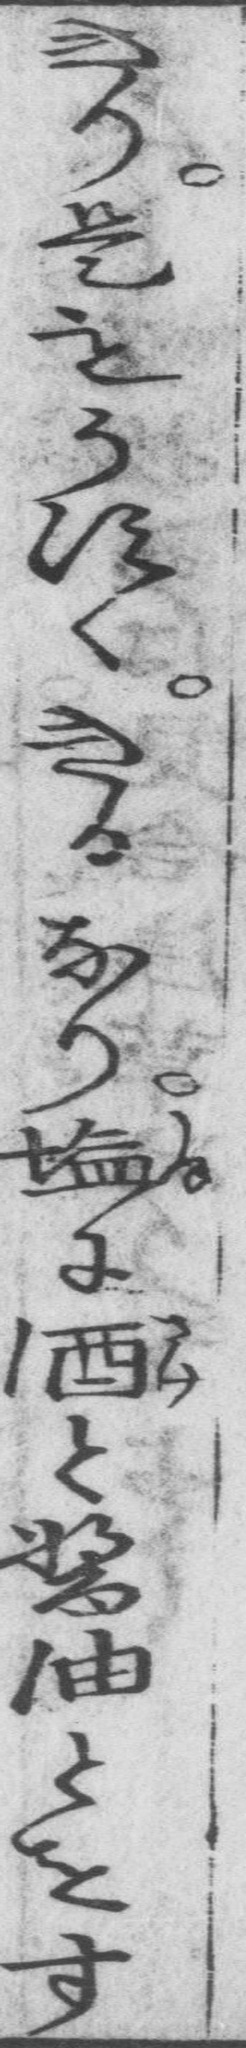きり。是をうすく。きるなり。塩に酒と醤油とをす
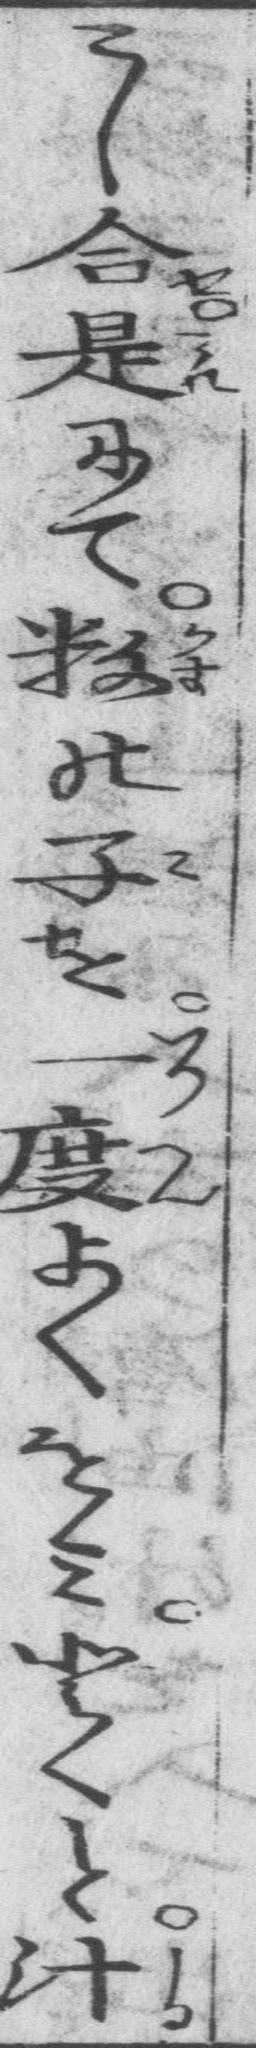こし合せ。是にて。数の子を。一度よくもみ。とくと。汁
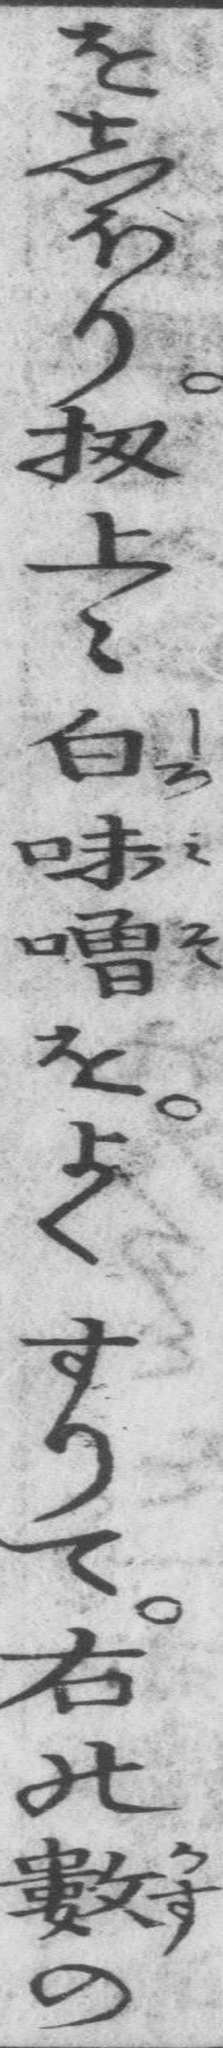をしほり。扨上々白味噌を。よくすりて。右の数の
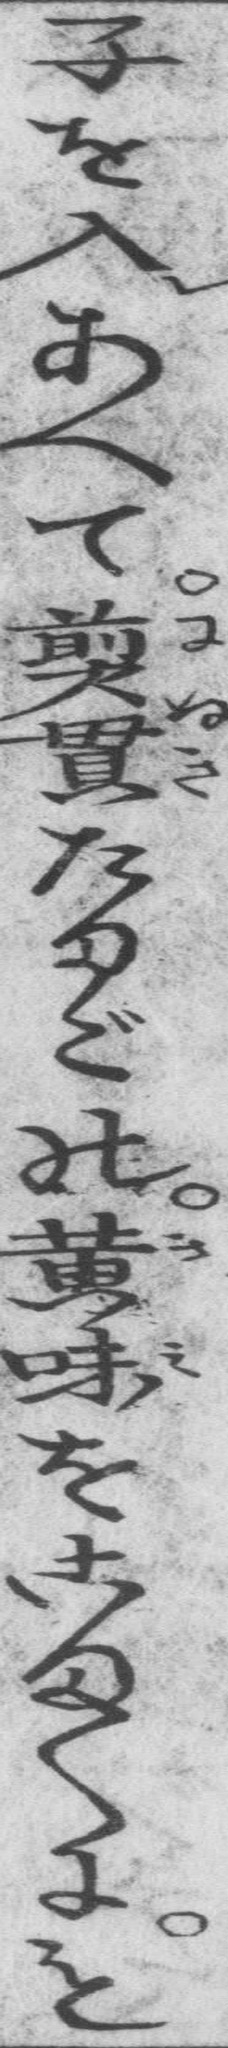子を入れあへて。煎貫たまごの。黄味をこま〳〵に。も
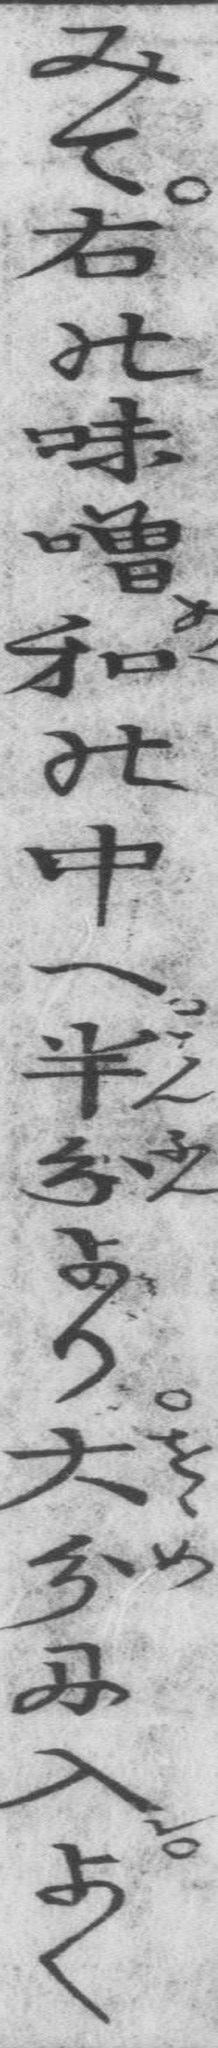みて。右の味噌和の中へ。半分より。大分に入れ。よく
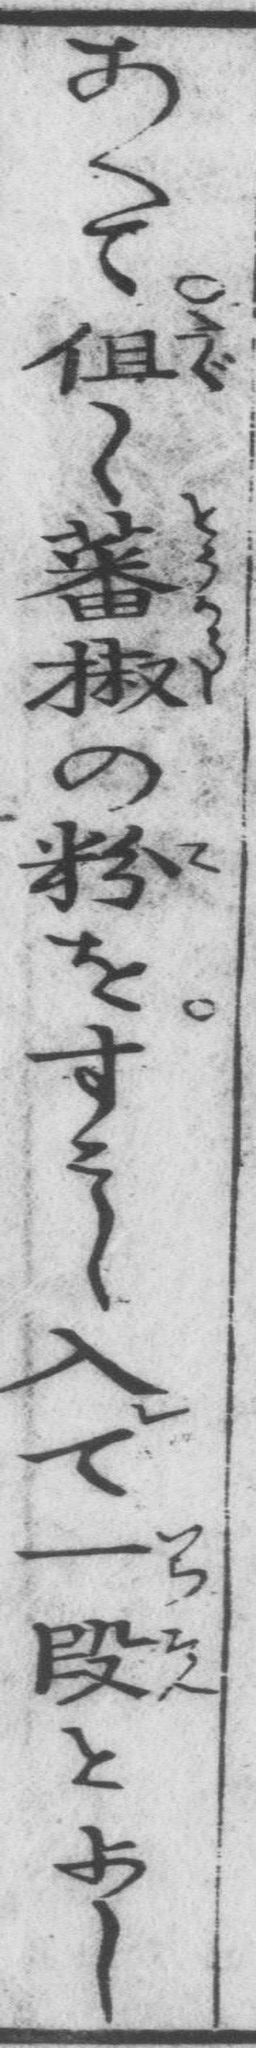あへて。但し蕃椒の粉を。すこし入れて一段とよし
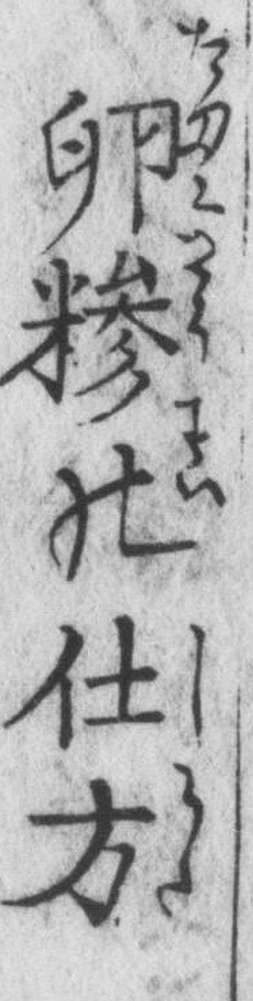卵糝の仕方
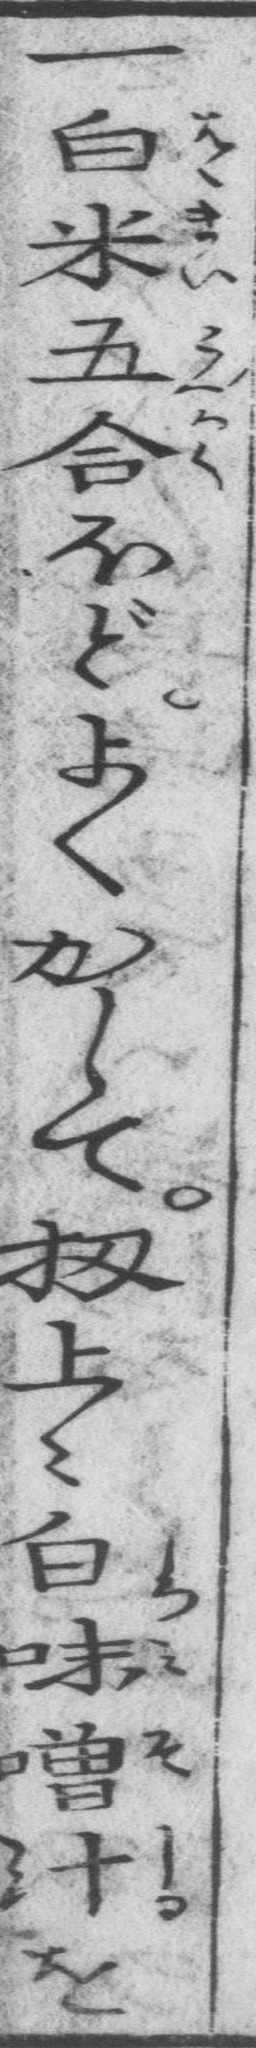一白米五合ほど。よくかして。扨上々白味噌汁を
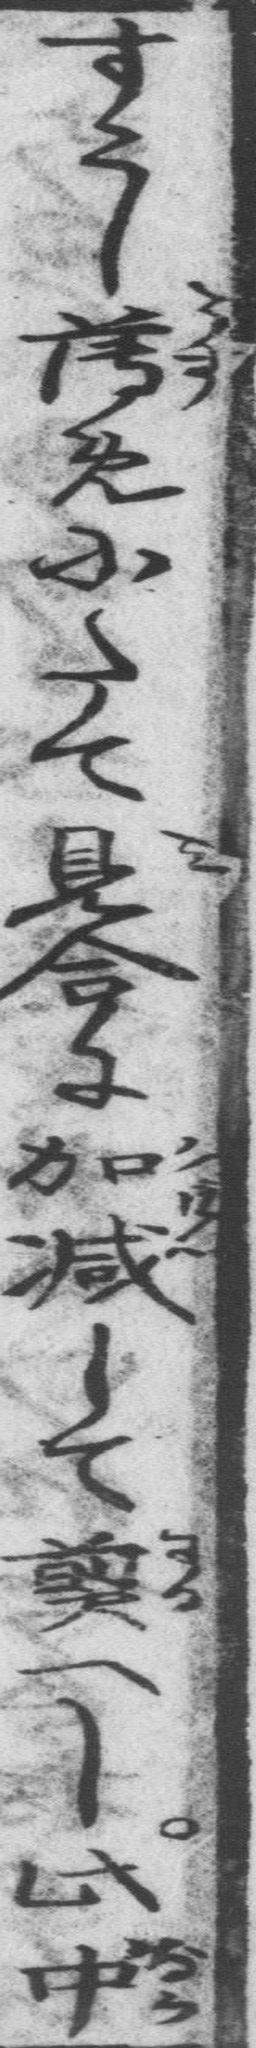すこし薄めにたて見合に加減して煎へし。此中
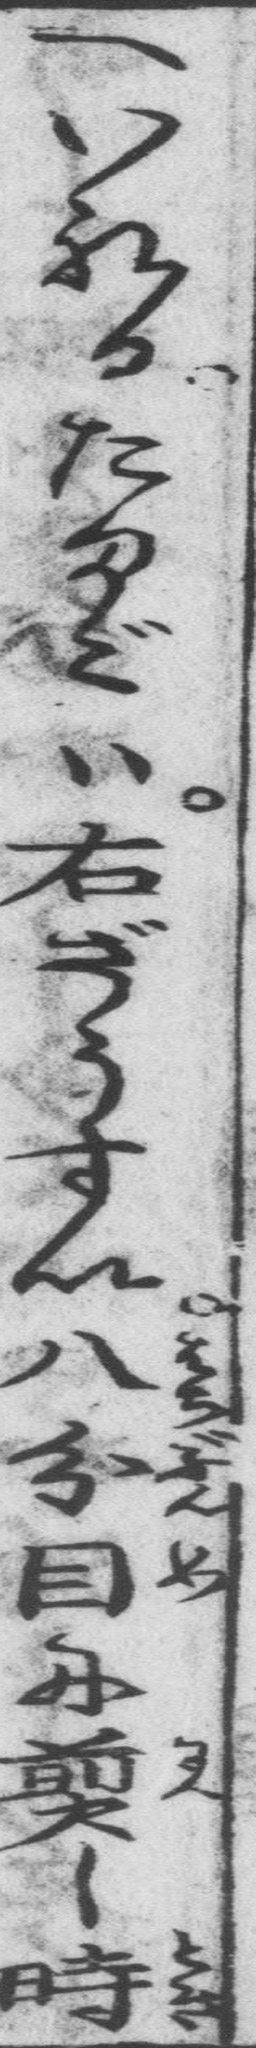へいれる。たまごは。右ざうすい。八分目に煎し時
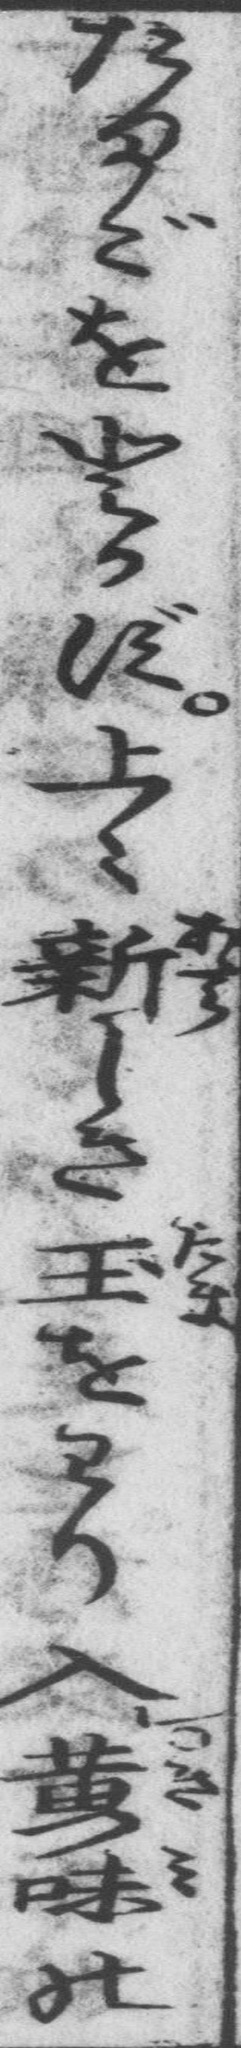たまごをとらず。上々新しき玉をわり入れ。黄味の
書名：萬寳料理秘密箱
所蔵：大阪府立大学学術情報センター 国文学研究資料館
